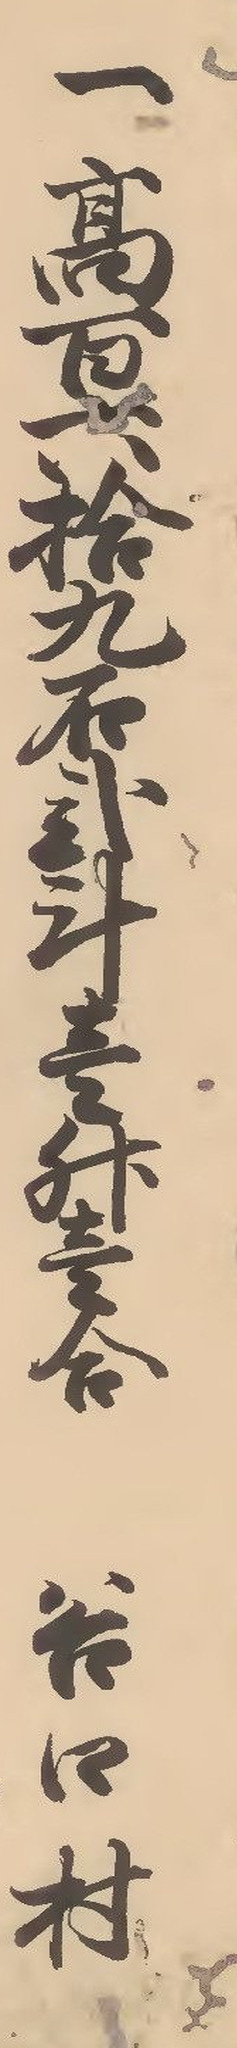一高百六拾九石弐斗壱升壱合谷口村
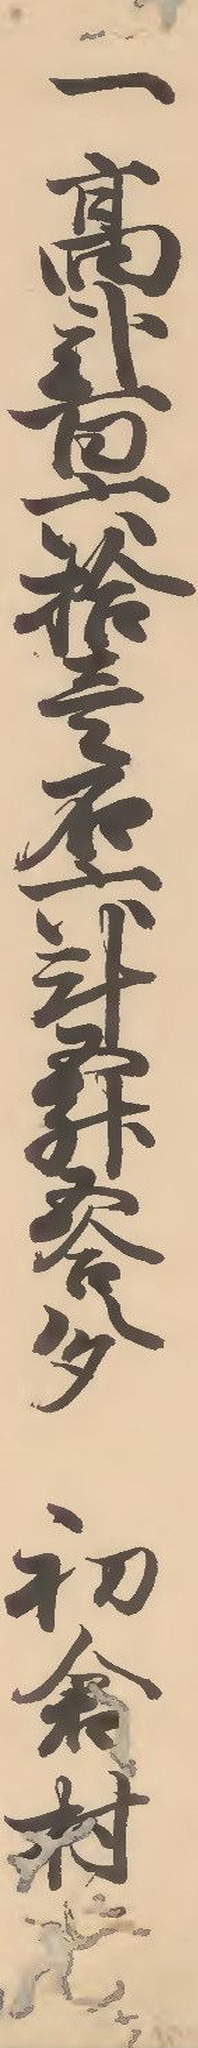一高弐百六拾壱石六斗五升五合八勺初倉村
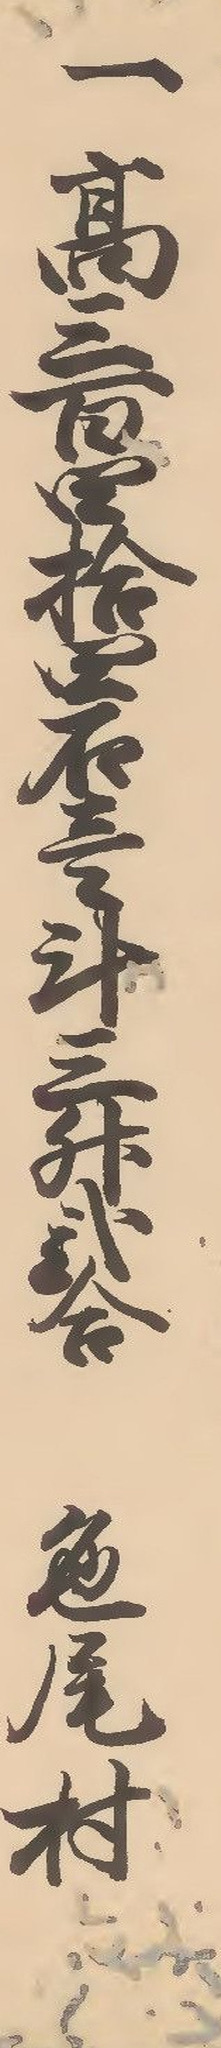一高三百四拾四石壱斗三升弐合色尾村
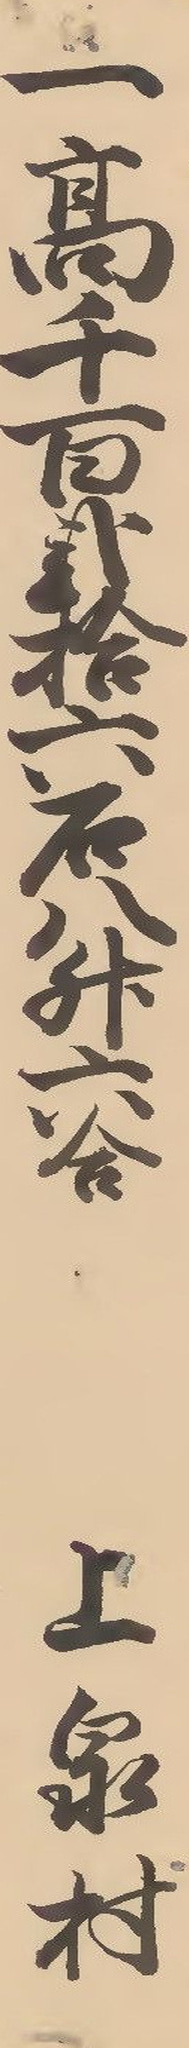一高千百弐拾六石八升六合上泉村
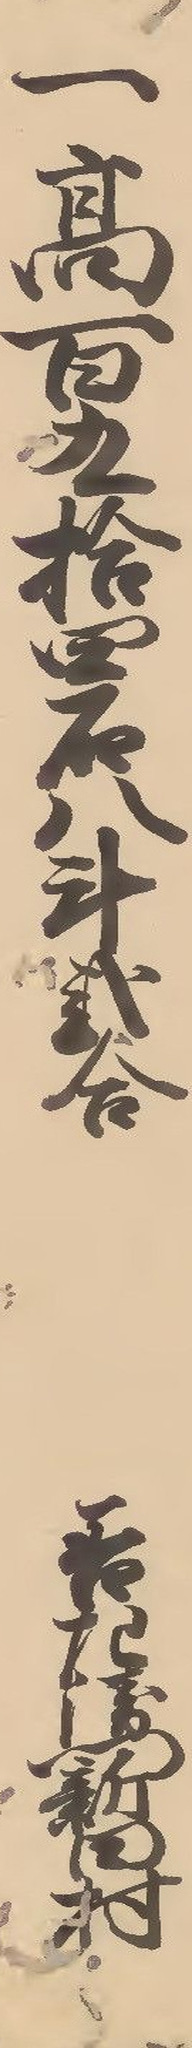一高百九拾四石八斗弐合善左衛門新田村
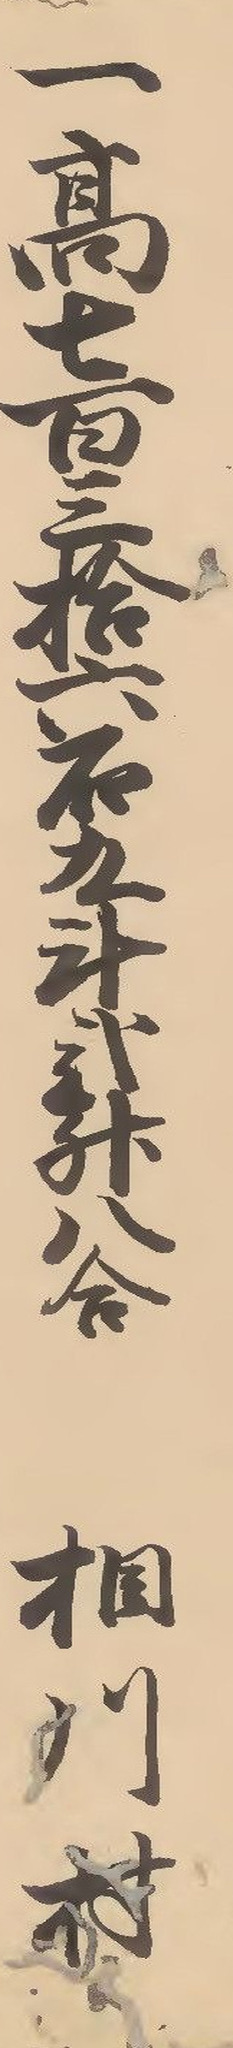一高七百三拾六石九斗弐升八合相川村
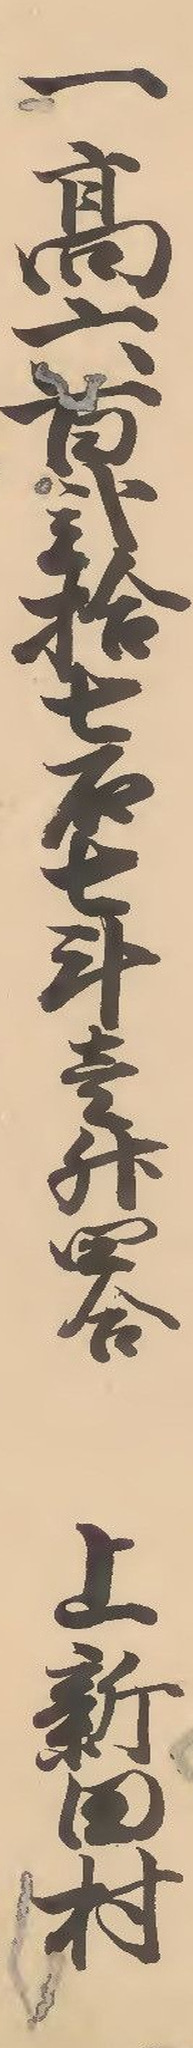一高六百弐拾七石七斗壱升四合上新田村

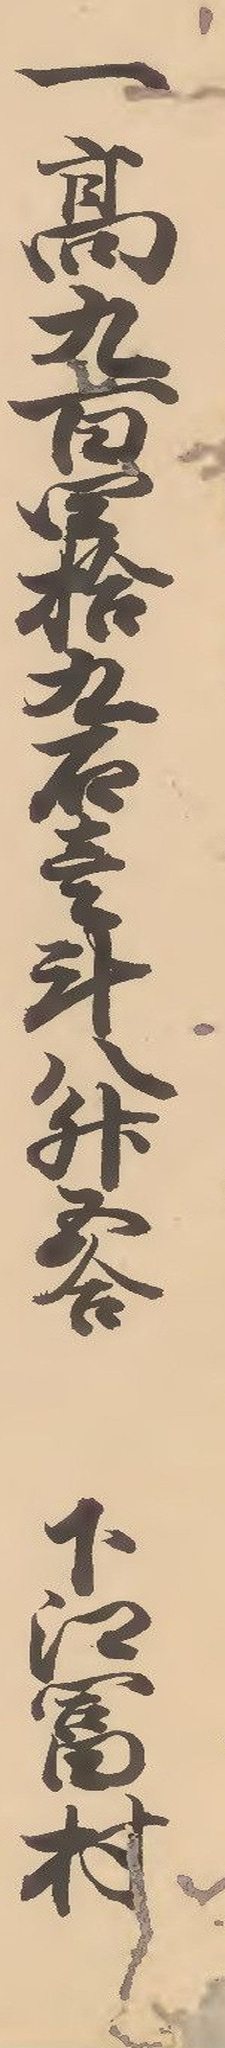一高九百四拾九石壱斗八升五合下江富村
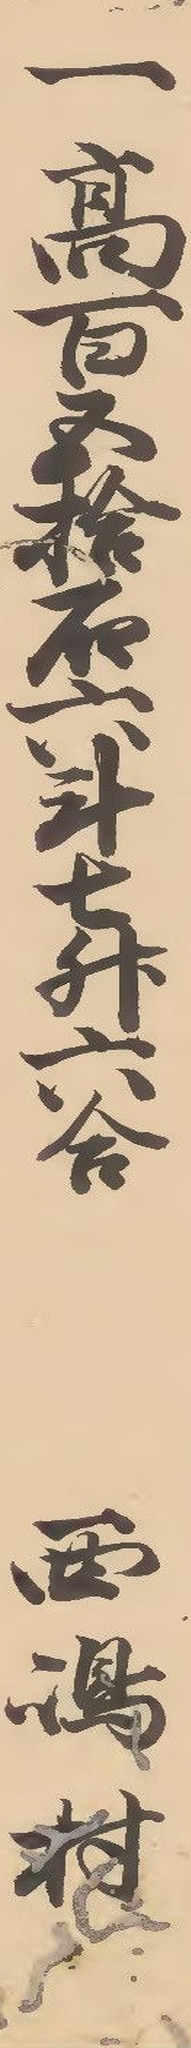一高百五拾石六斗七升六合西島村
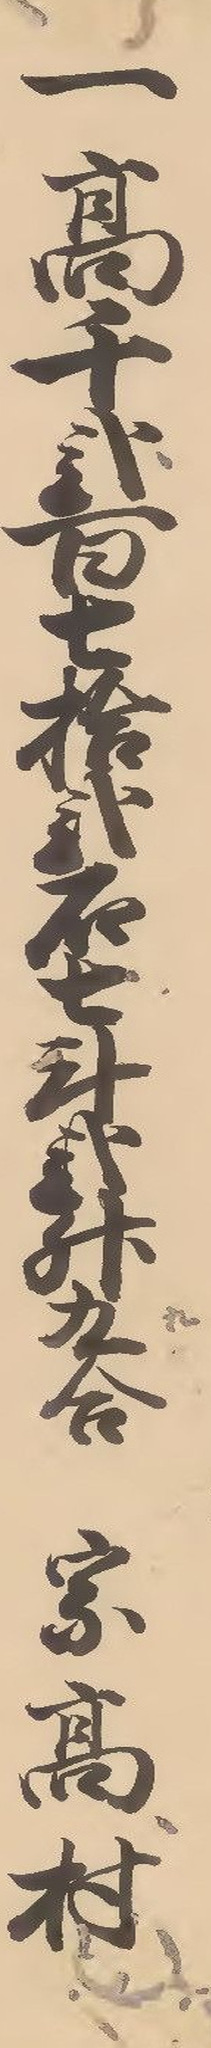一高千弐百七拾弐石七斗弐升九合宗高村
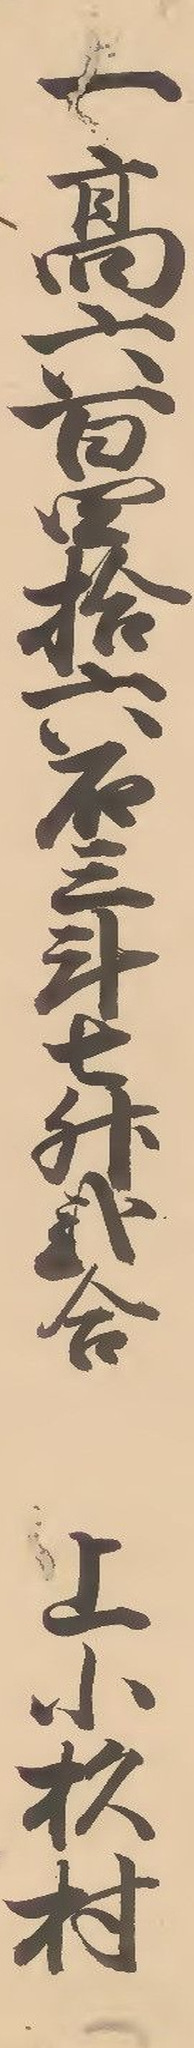一高六百四拾六石三斗七升弐合上小杉村
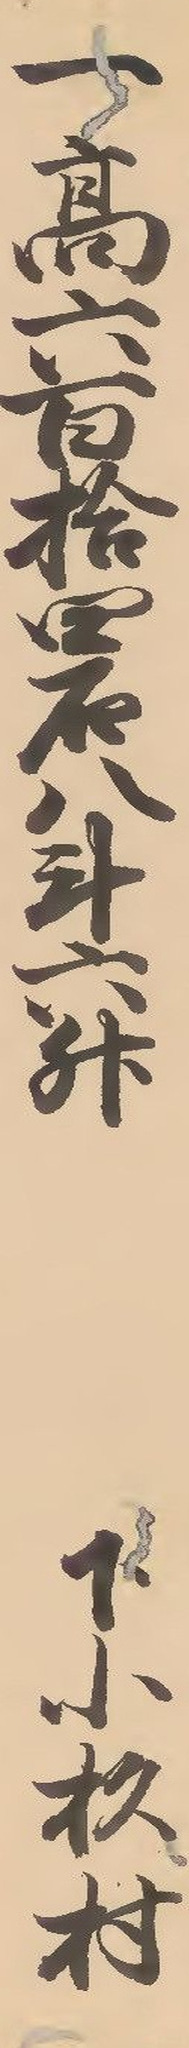一高六百拾四石八斗六升下小杉村
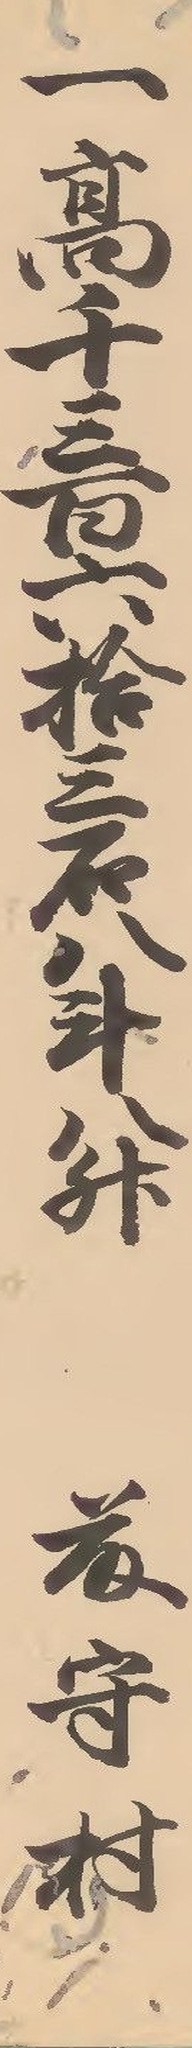一高千三百六拾三石八斗八升藤守村
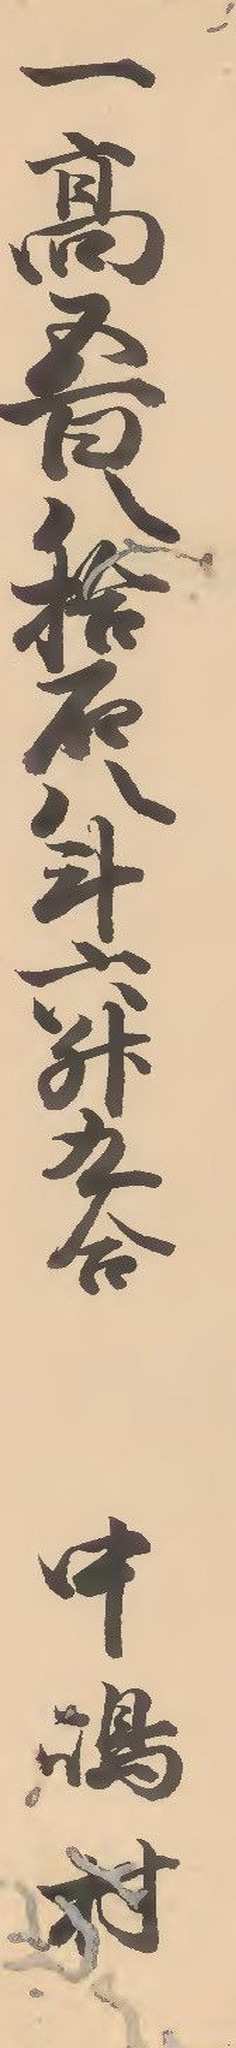一高五百八拾石八斗六升九合中島村
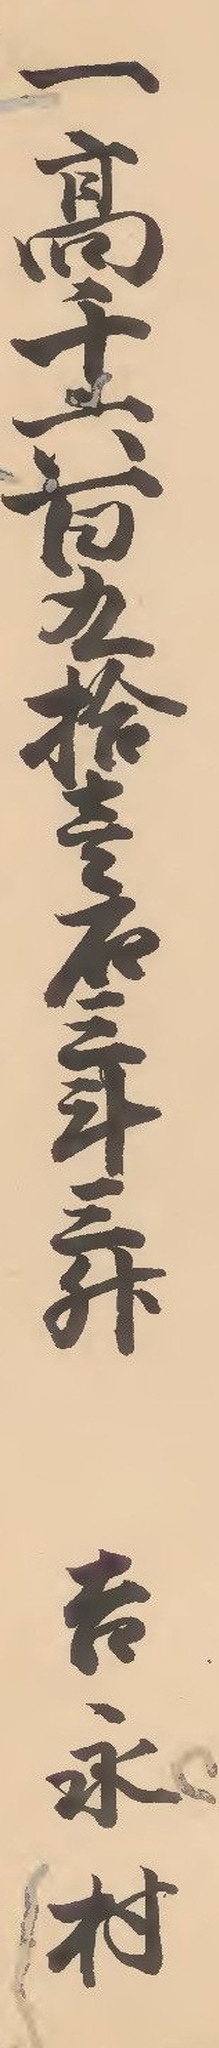一高千六百九拾壱石三斗三升吉永村

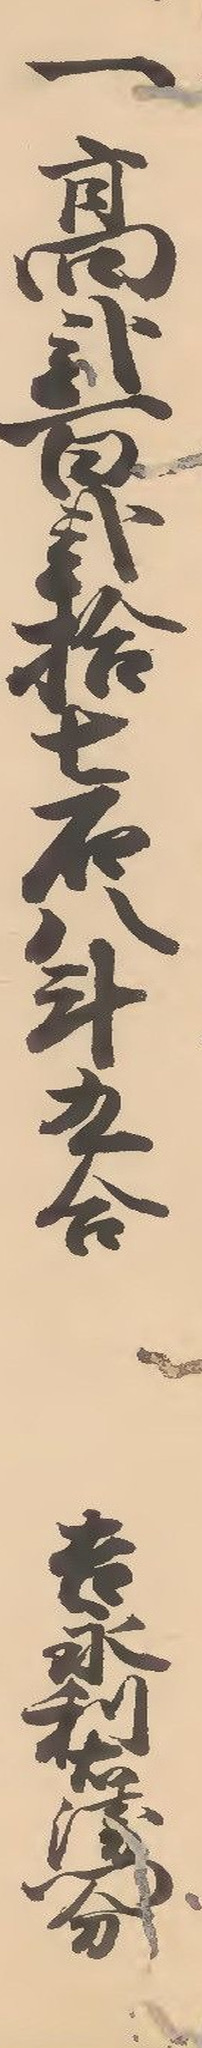一高弐百弐拾七石八斗九合吉永利右衛門分
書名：遠江国郷帳
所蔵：国立公文書館 National Archives of Japan
